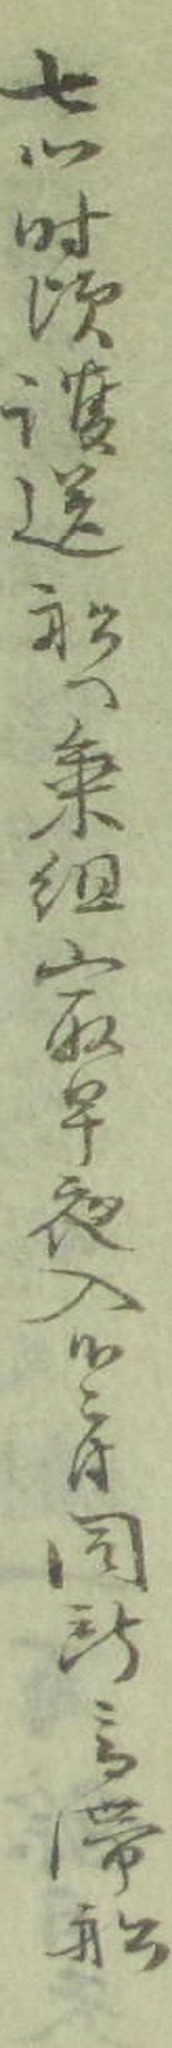七ツ時頃護送船へ乗組最早夜入候に付同所に而滞船
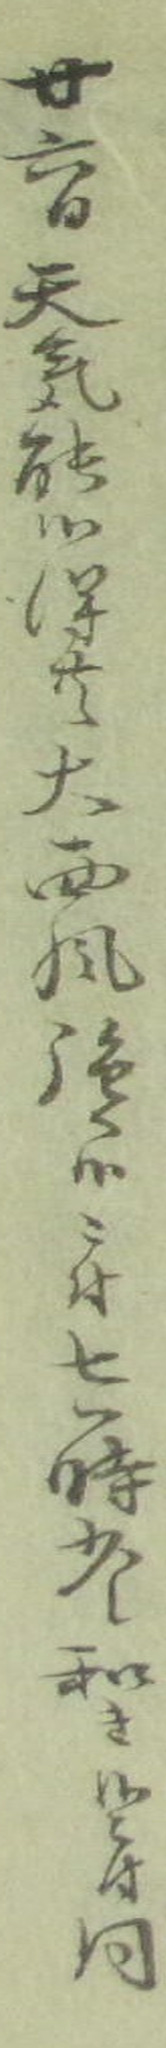廿六日天気能候得共大西風強く候に付七ツ時少し和き候に付同
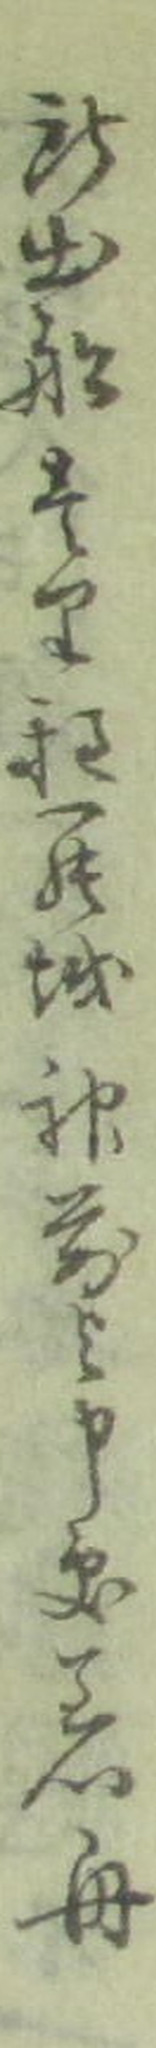所出船壱里程罷越神前与申処着舟
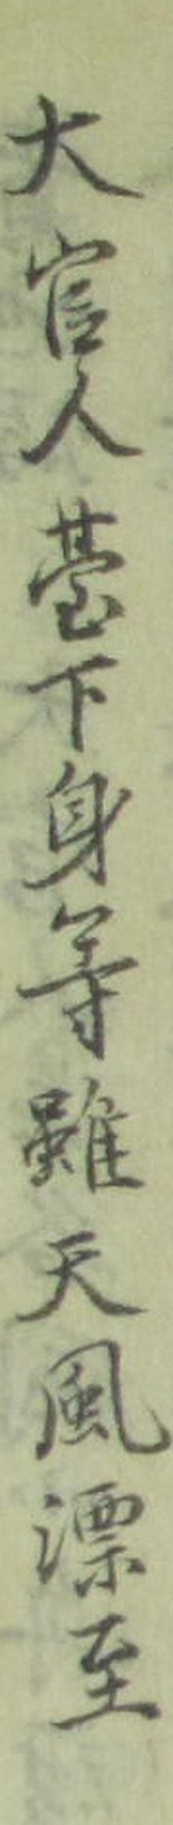大官人台下身等雖天風漂至

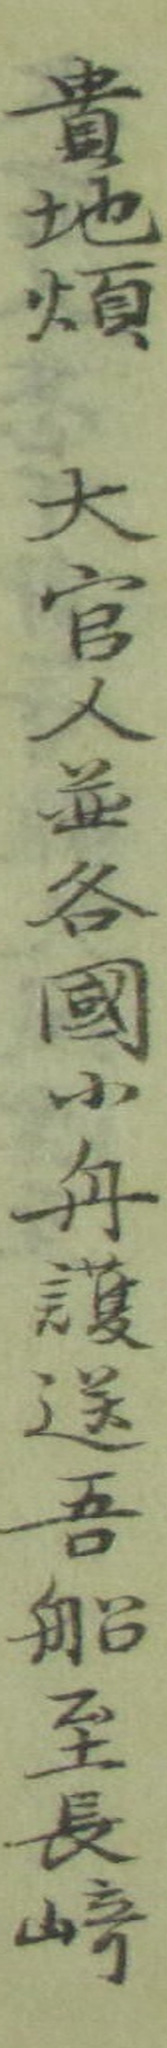貴地煩大官人並各国小舟護送吾船至長崎
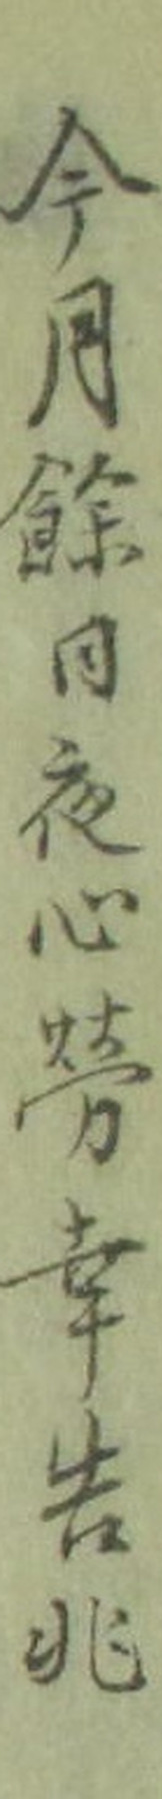今月余日夜心労幸告兆
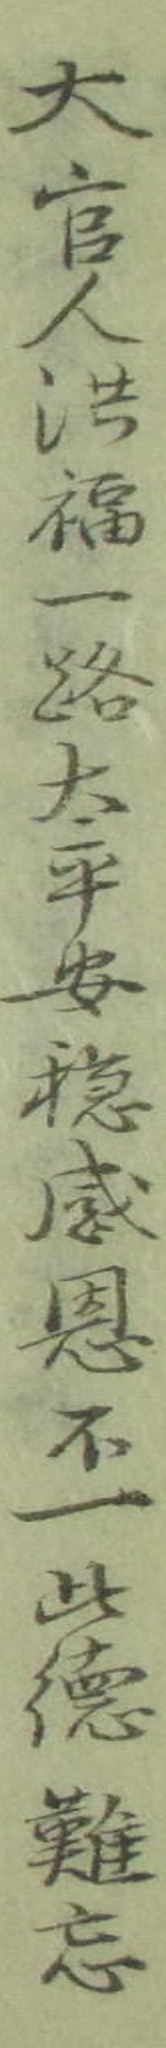大官人洪福一路太平安穏感恩不一此徳難忘
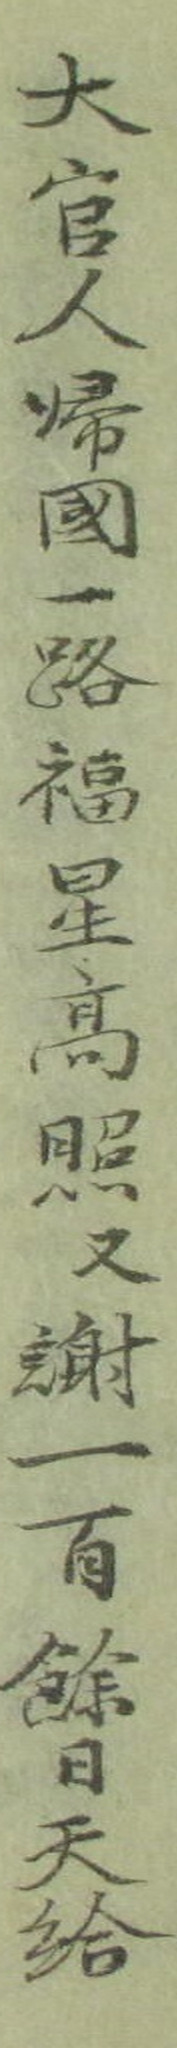大官人帰国一路福星高照又謝一百余日天給
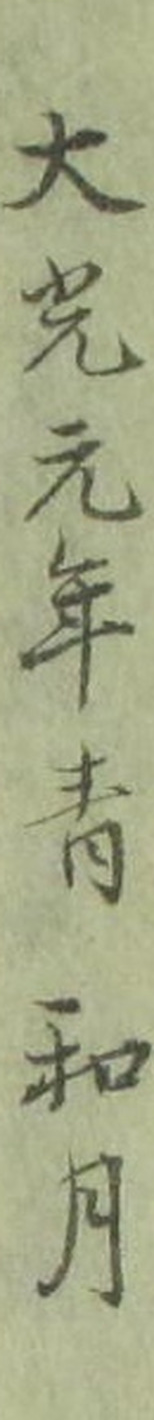大光元年青和月
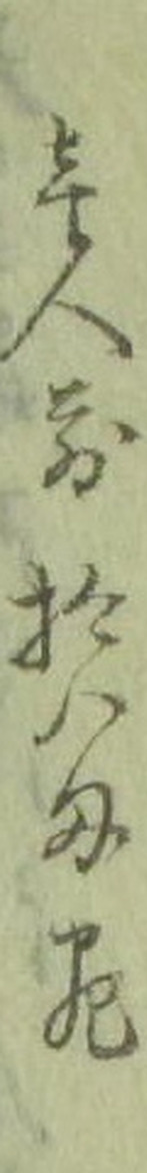壱人前拾八匁宛
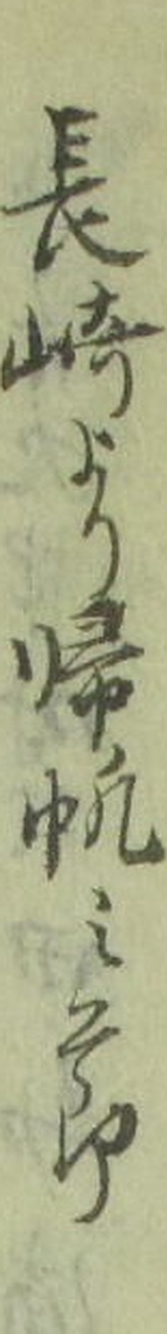長崎より帰帆之節
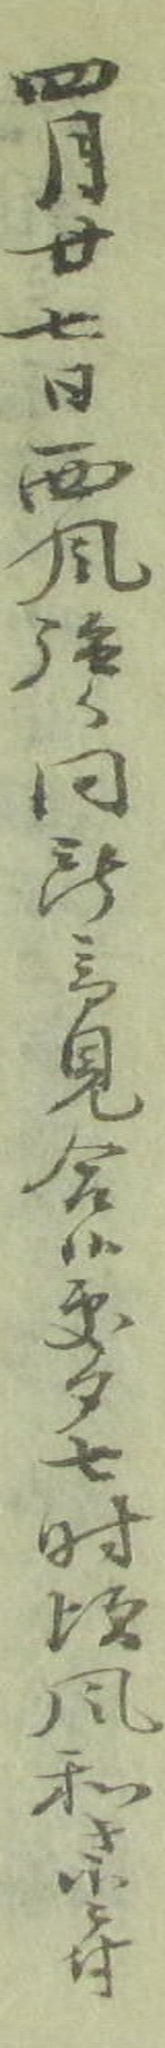四月廿七日西風強く同所に而見合候処夕七時頃風和き候に付
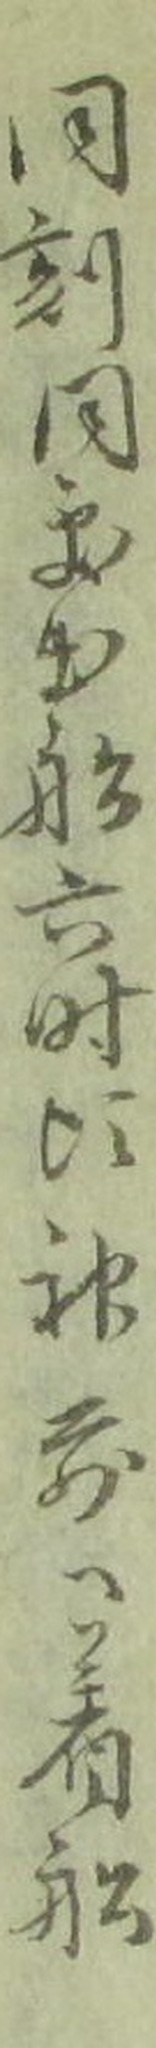同刻同処出船六時頃神前へ着船
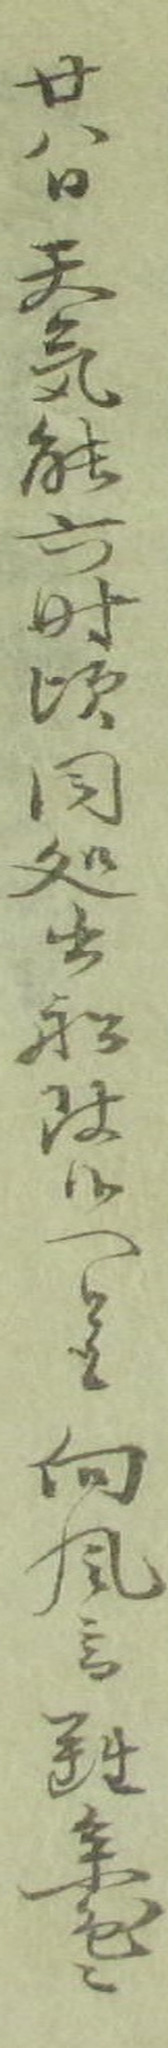廿八日天気能六時頃同処出船致候へとも向風に而難参色々
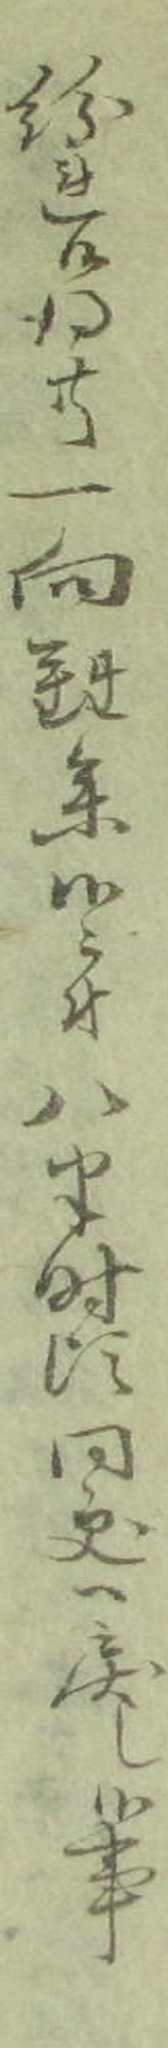紛れ候得共一向難参候に付八半時頃同処へ戻し候事
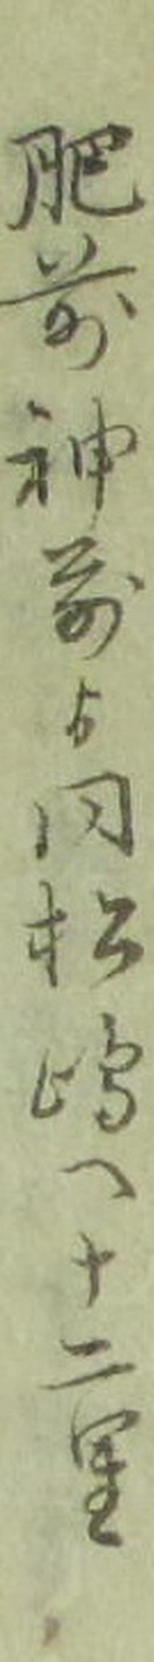肥前神前ゟ同松嶋へ十二里
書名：紀州九木浦庄屋記録 四
